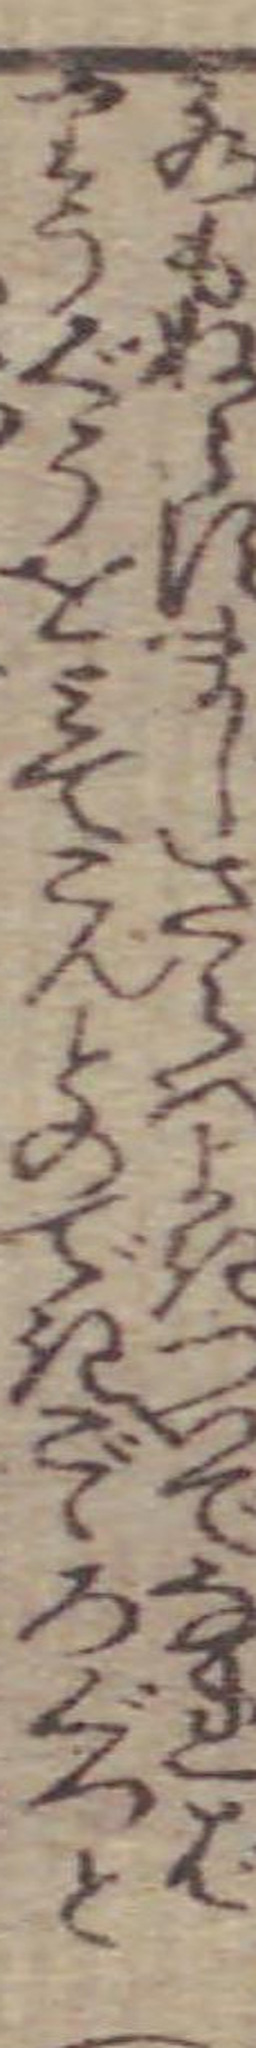りうぐうをみてこんとのできごゝろぐつと
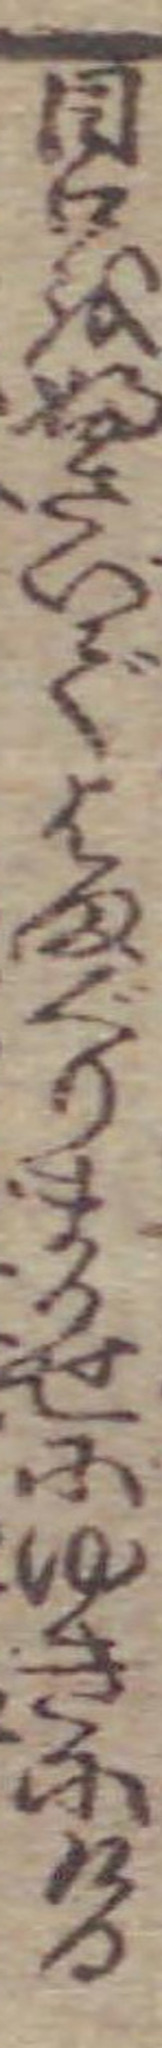目口をふさいではまぐりまかせにゆきにける
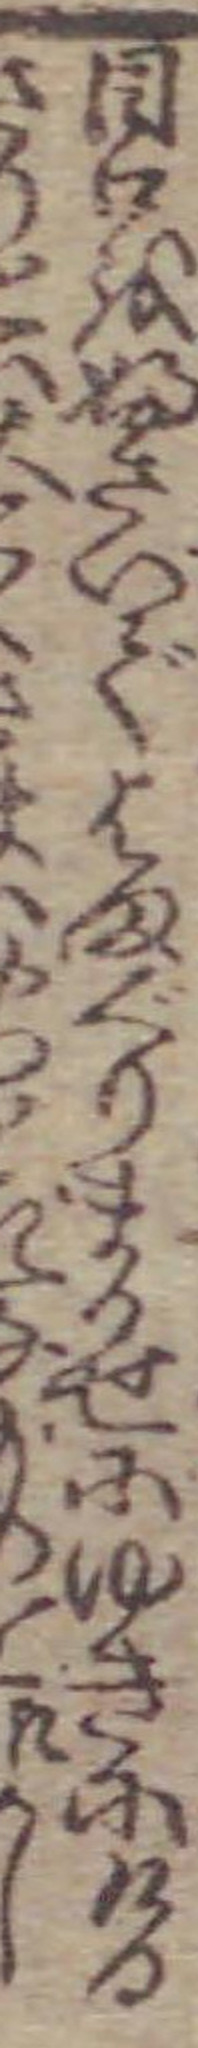目口をふさいではまぐりまかせにゆきにける
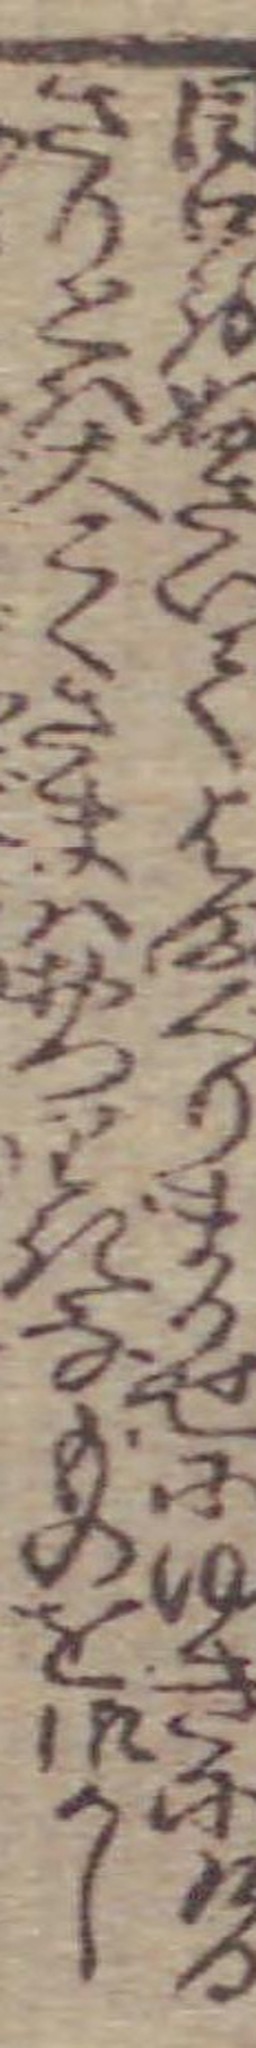さりとは大こくさまはおつりきなるものを御かし
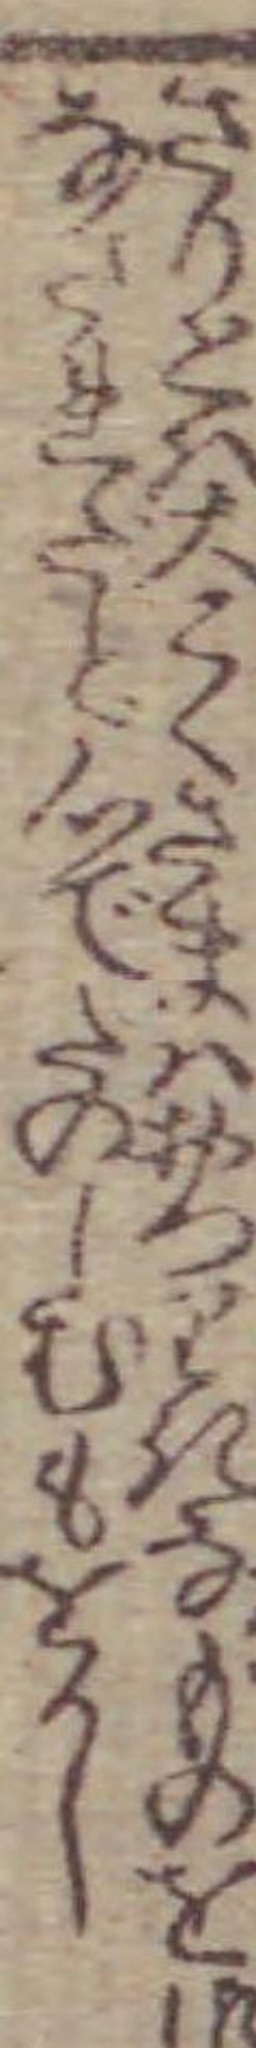なされたと心でたのしむもをかし
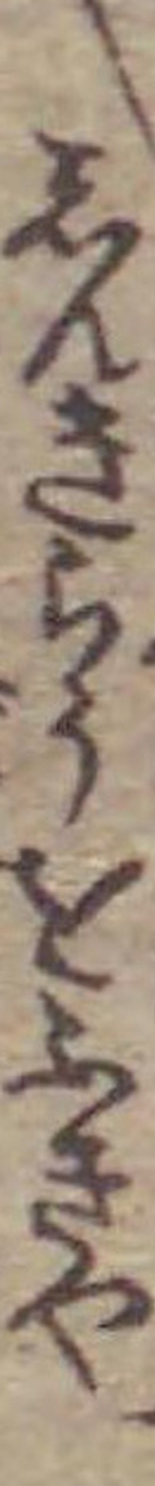しんきらうをふきや
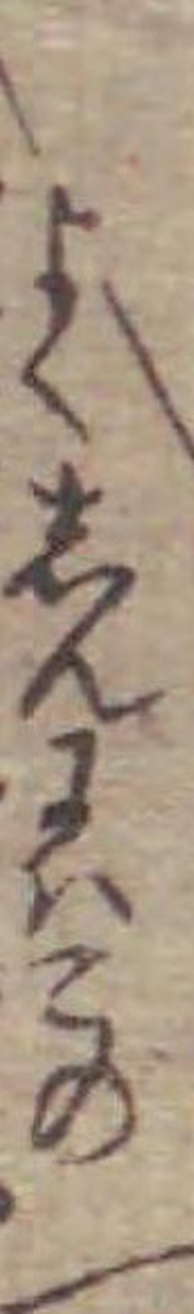よくしんにはこの
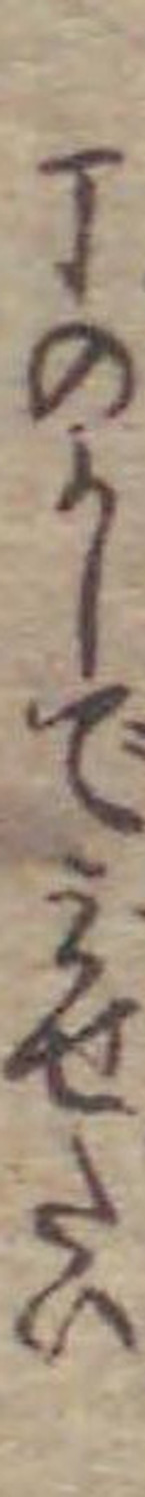丁のかしでみせたい

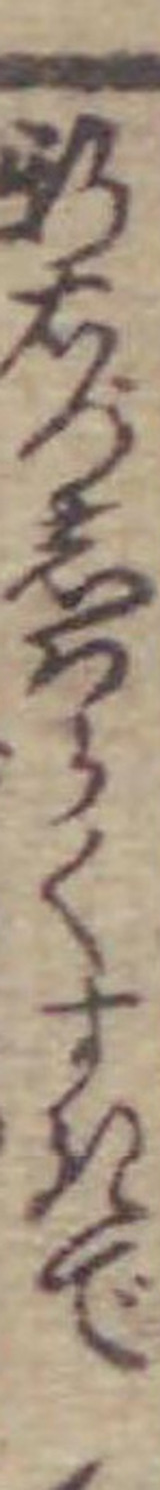新右衛門しはらくすきで
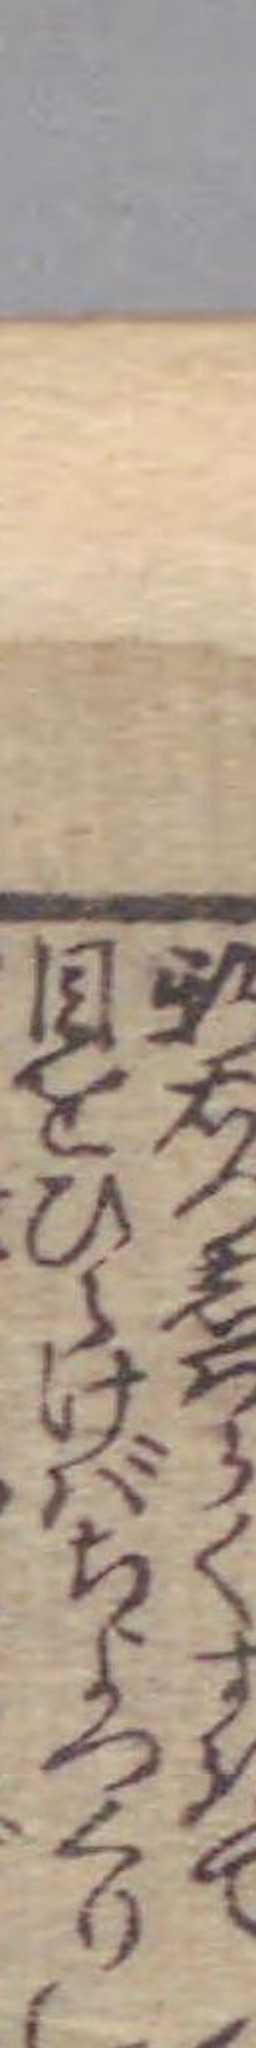目をひらけばちよつくり
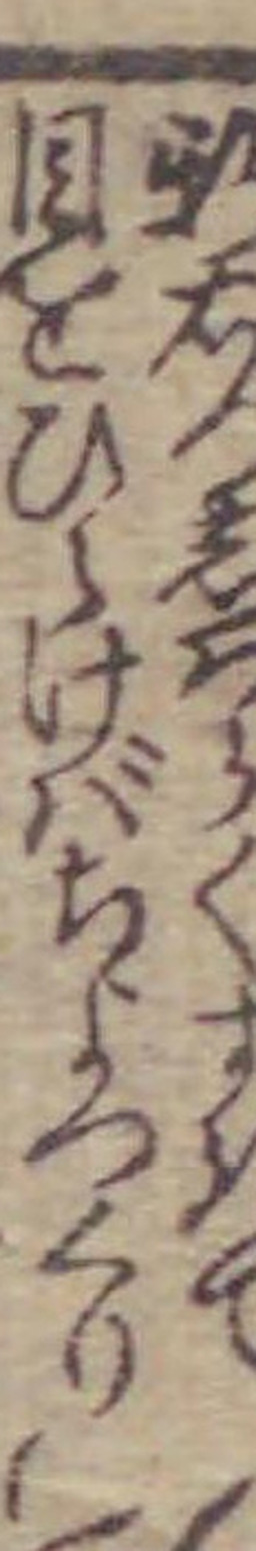目をひらけばちよつくり
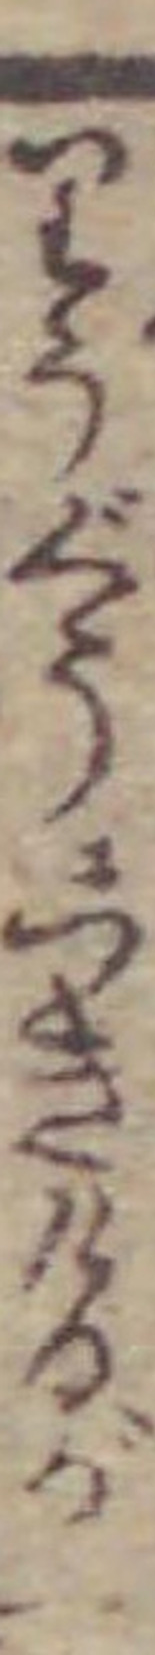りうぐうにつきけるが
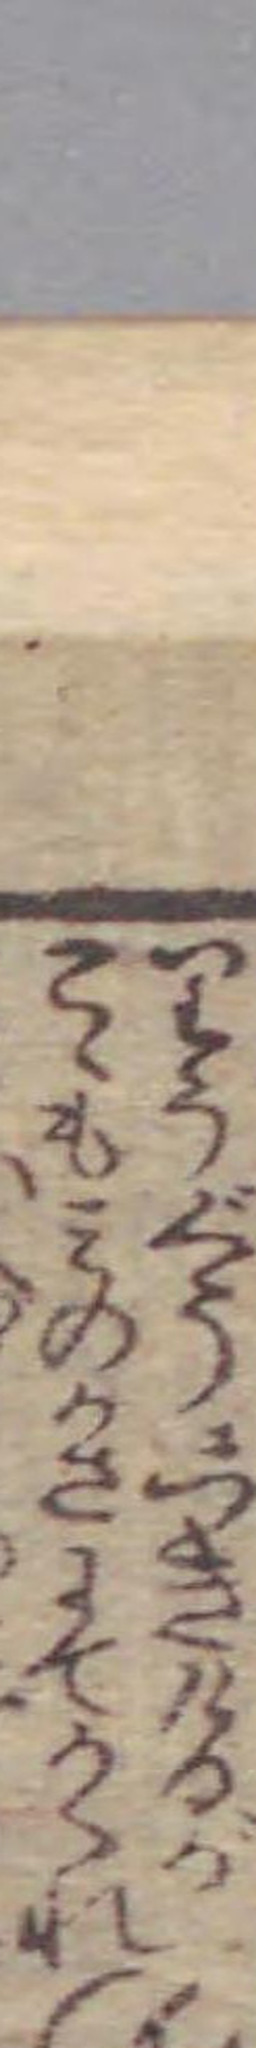こゝもみのかさにてかくれ
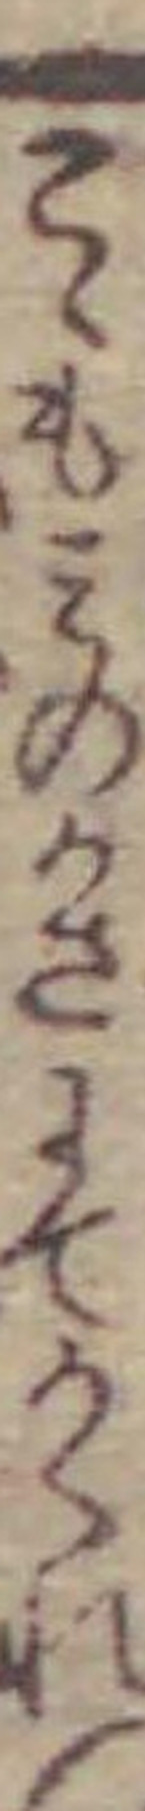こゝもみのかさにてかくれ
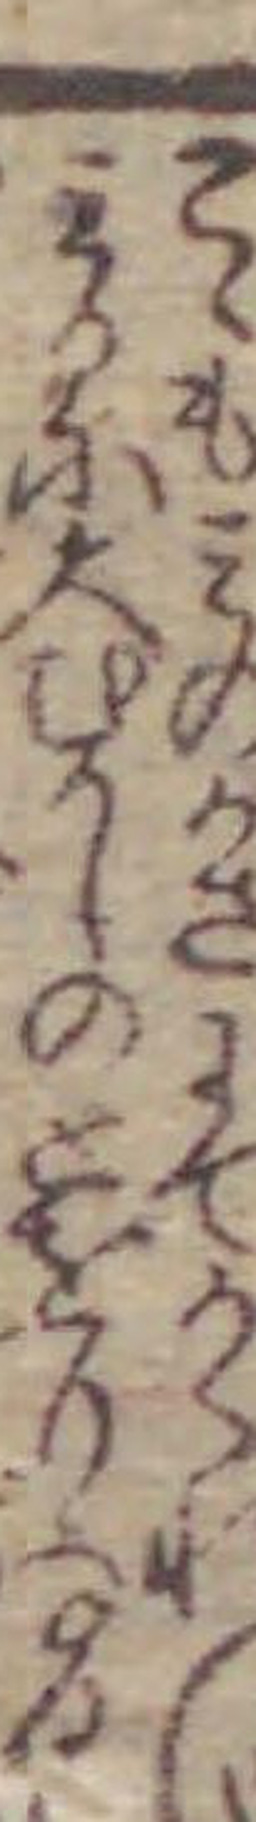みるに大むかしのとをりなる
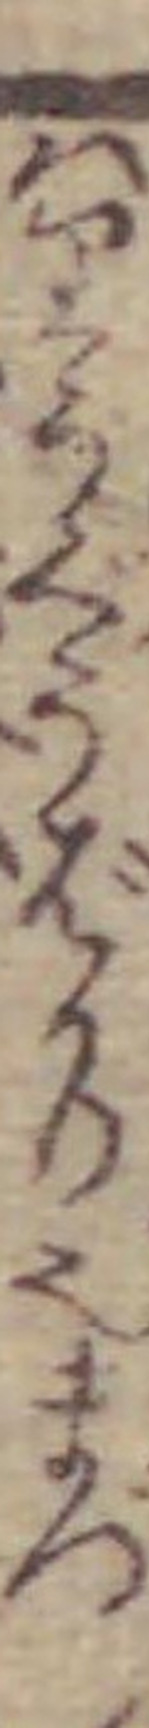はりうぐうばかり也まづ
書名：即席耳学問 : 3巻
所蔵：国立国会図書館 National Diet Library, JAPAN
